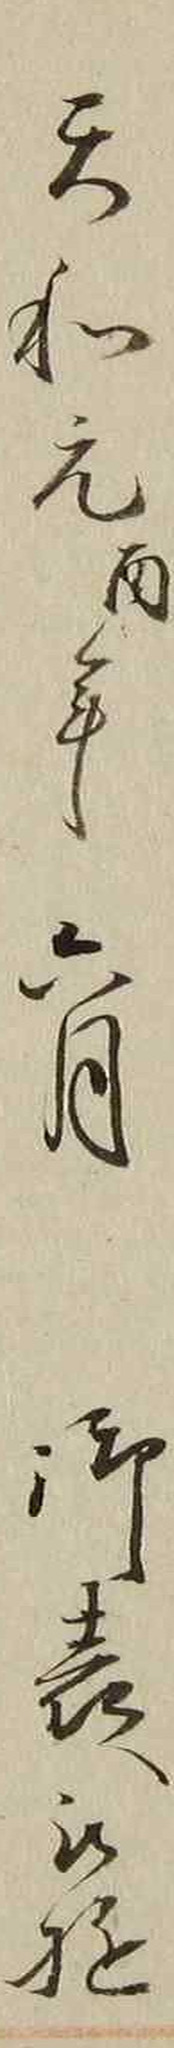一天和元酉年六月御表へ被遊
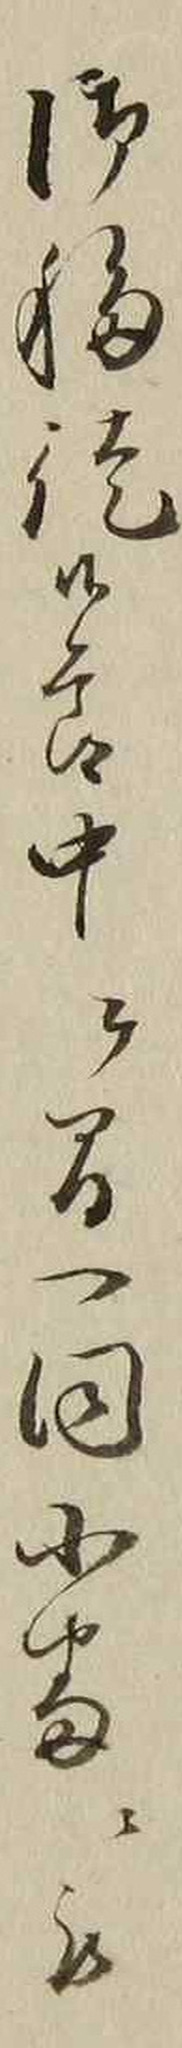御移徒候節中ヶ間一同小番に被
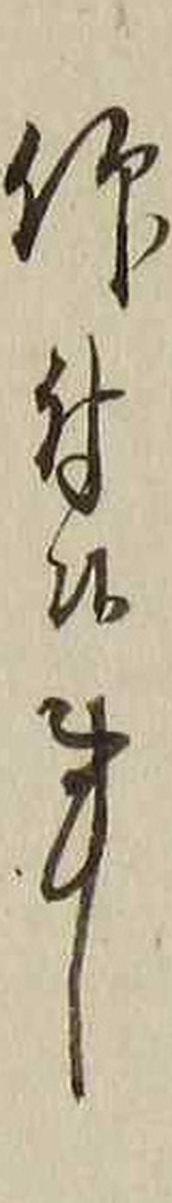仰付候事
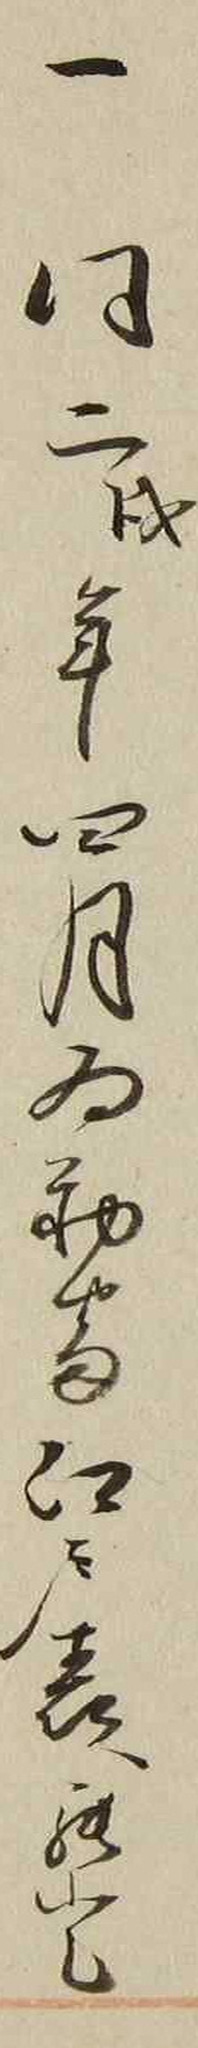一同二戌年四月為勤番江戸表へ罷登
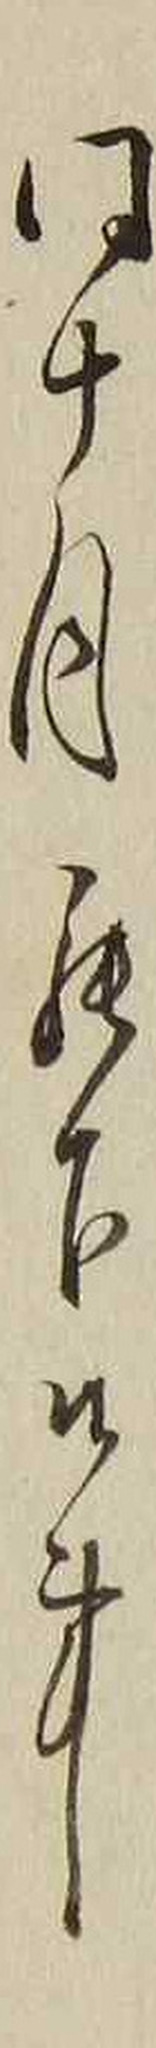同十月罷下候事
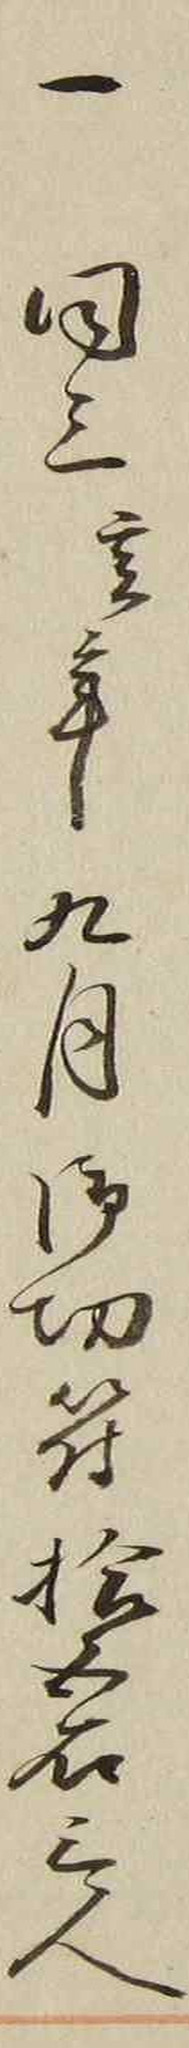一同三亥年九月御切符十五石三人
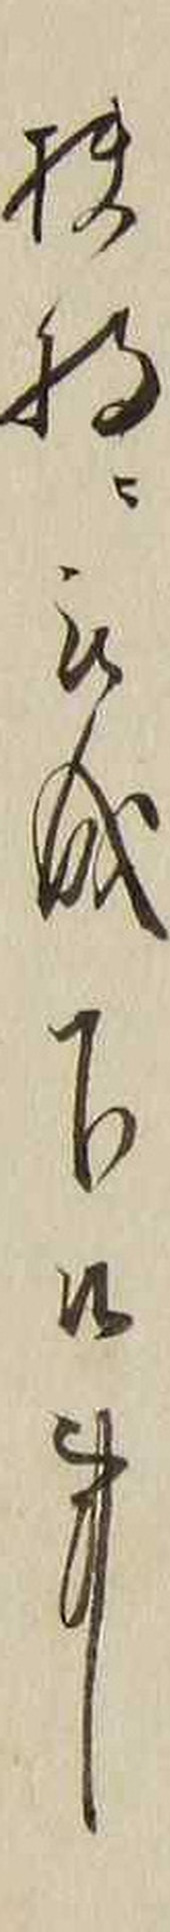扶持に被成下候事
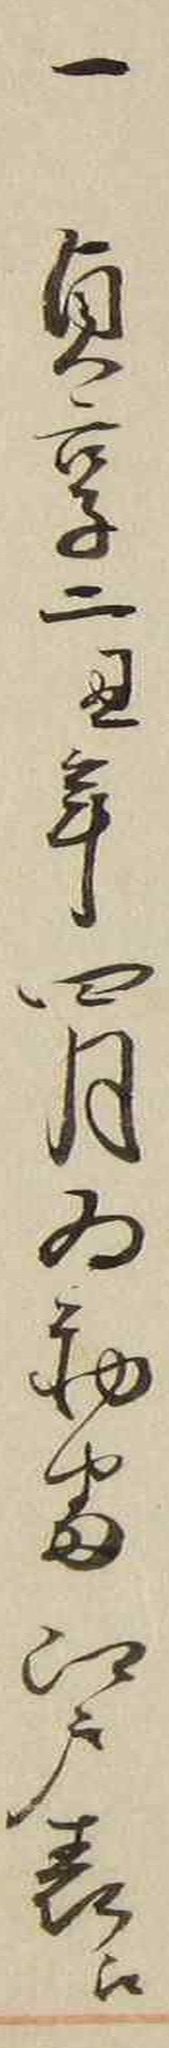一貞享二丑年四月為勤番江戸表へ

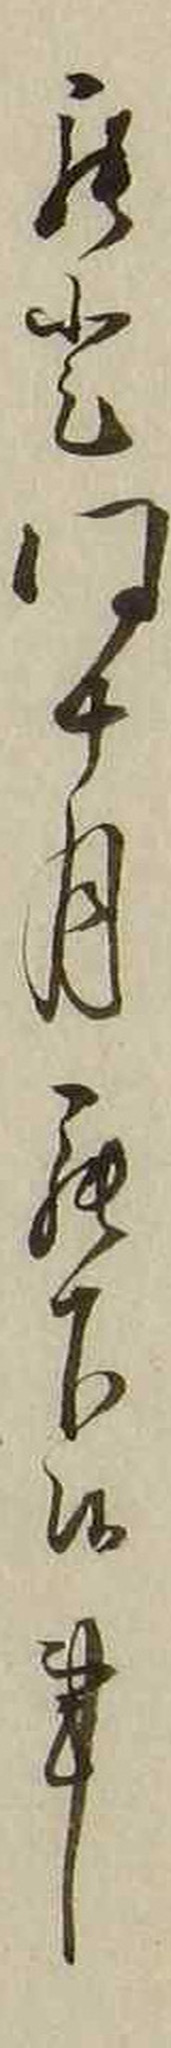罷登同十月罷下候事
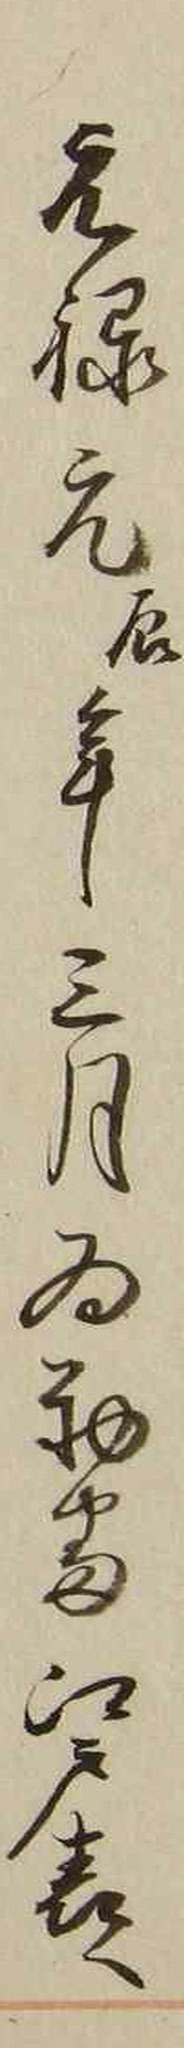一元禄元辰年三月為勤番江戸表へ
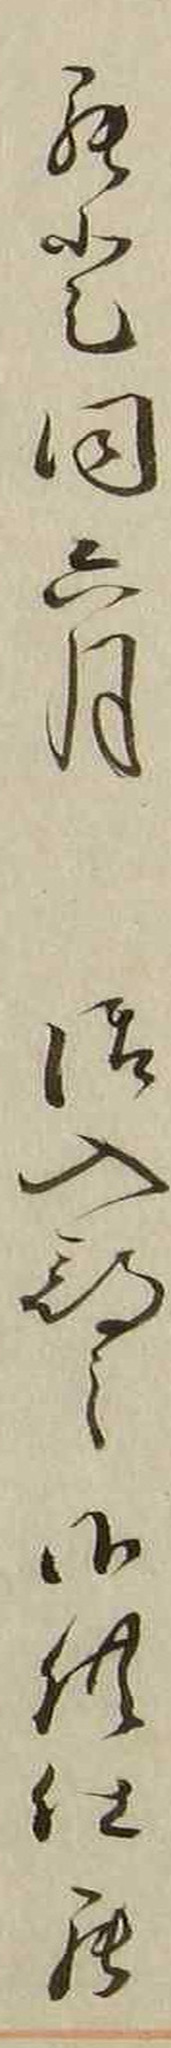罷登同六月御入部之御供仕罷
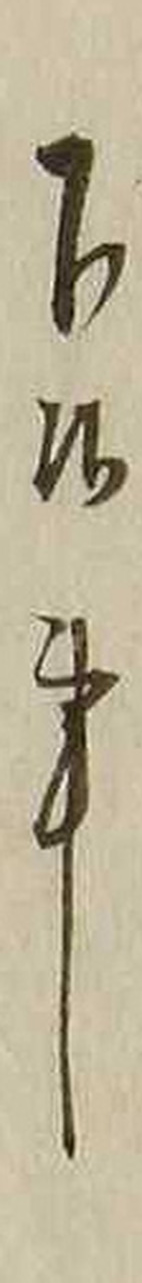下候事
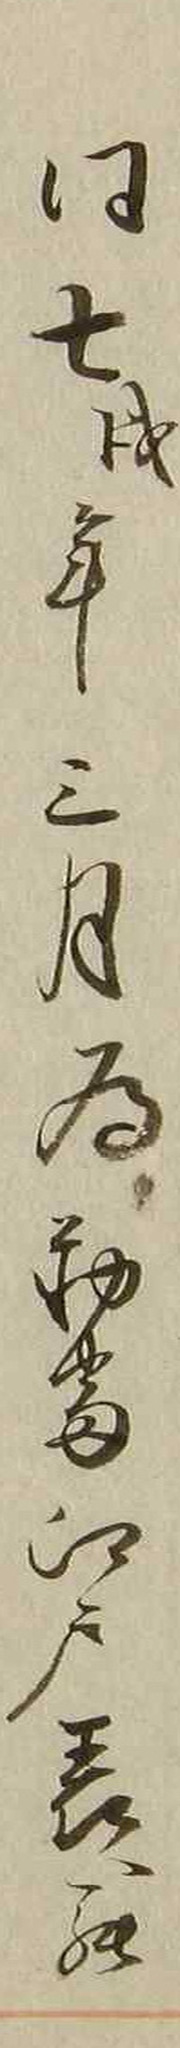一同七戌年三月為勤番江戸表へ罷
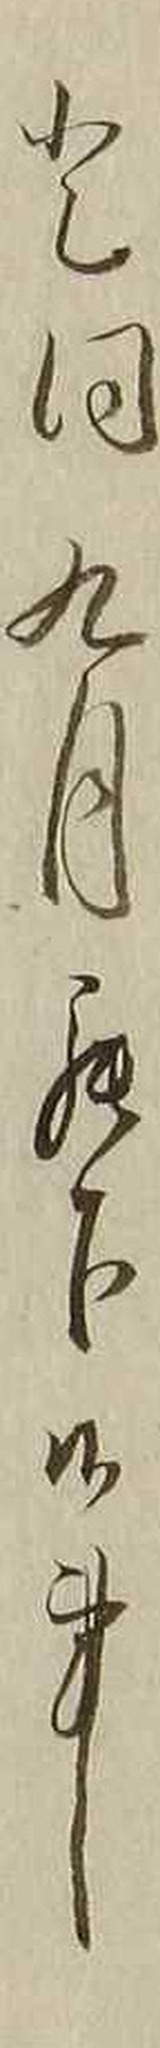上同九月罷下候事
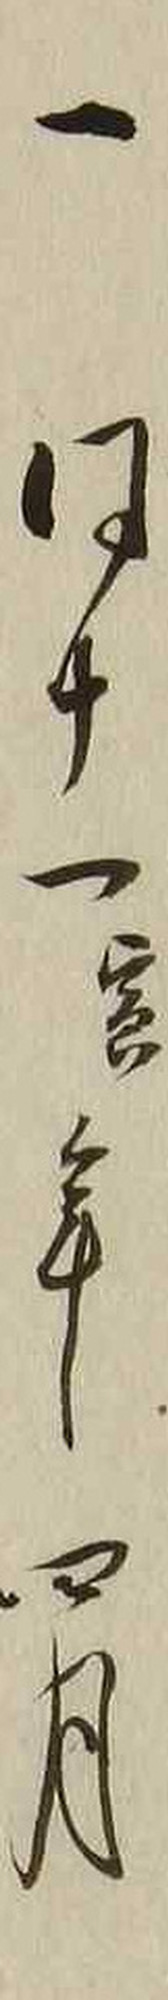一同十一寅年四月
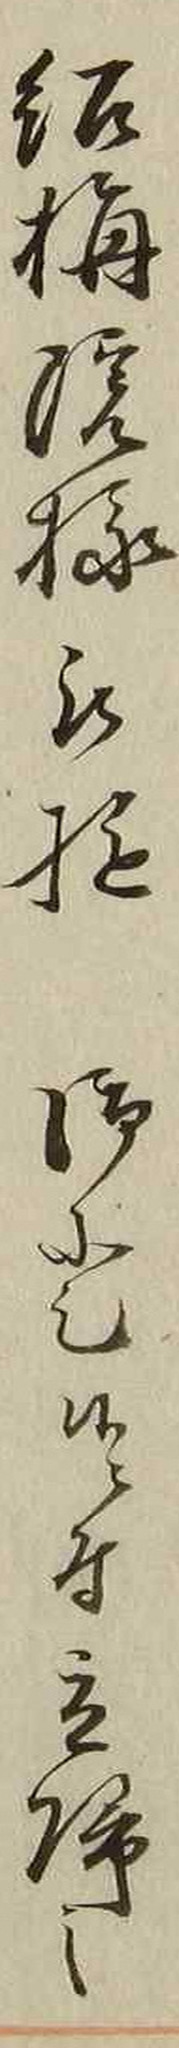紹梅院様被遊御登候に付立帰之
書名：諸士系譜　巻之170　な之部12
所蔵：会津若松市立会津図書館
